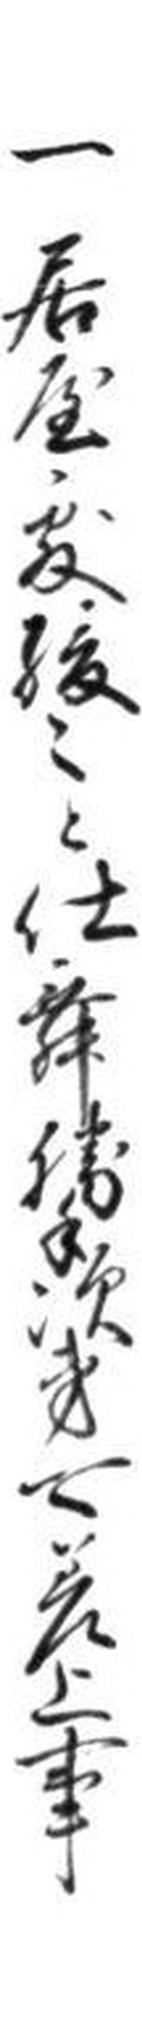一居屋敷緩々と仕舞勝手次第可差上事
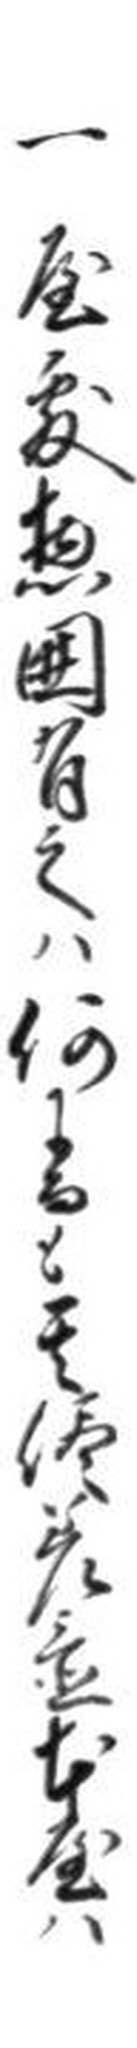一屋敷惣囲有之ハ何ニ而も其侭差置本屋ハ
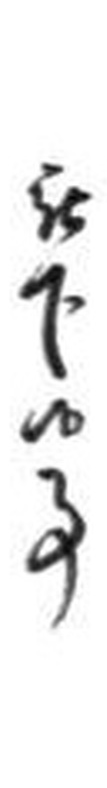被下候事
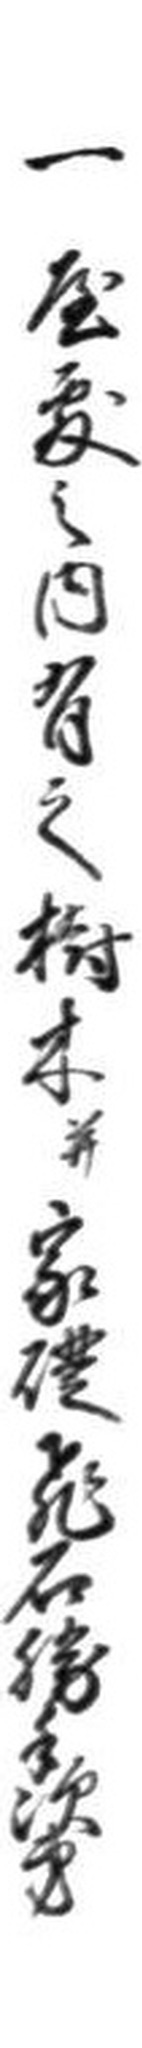一屋敷之内有之樹木幷家僕飛石勝手次第
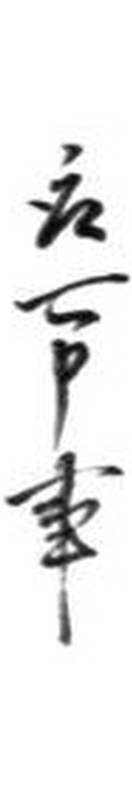取可申事
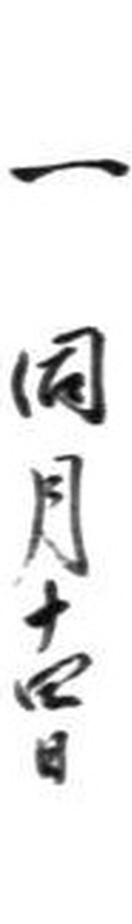一同月十四日
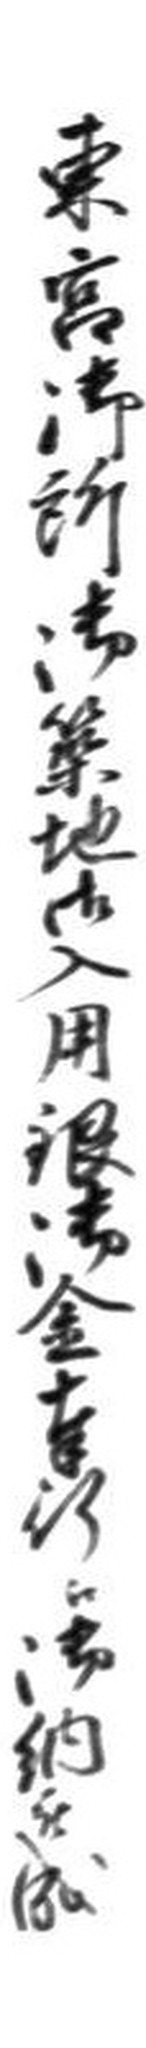東宮御所御築地御入用銀御金奉行江御納被成
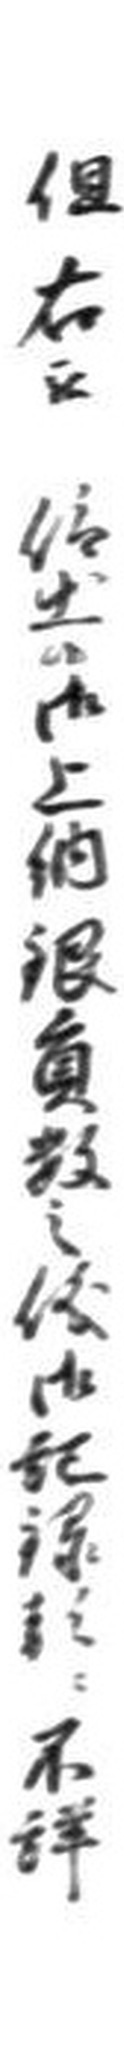但右被仰出候御上納銀負数之儀御記録類ニ不詳
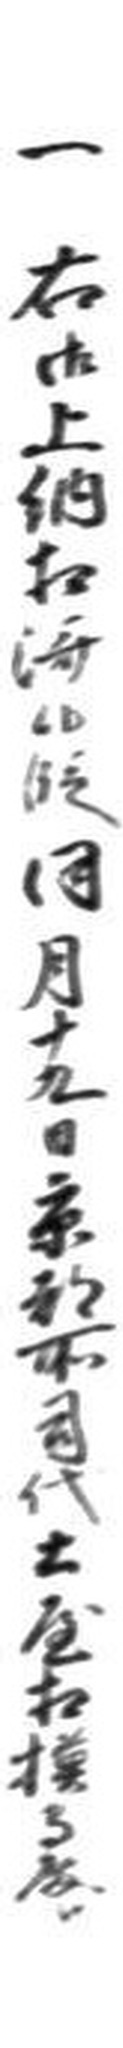一右御上納相済候間段同月十九日京都所司代土屋相模守殿江
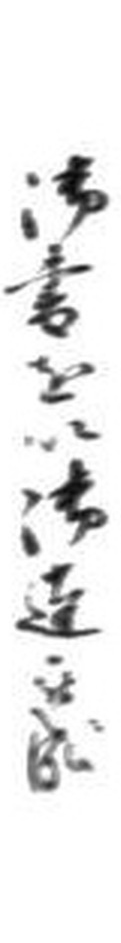御書を以御達被成

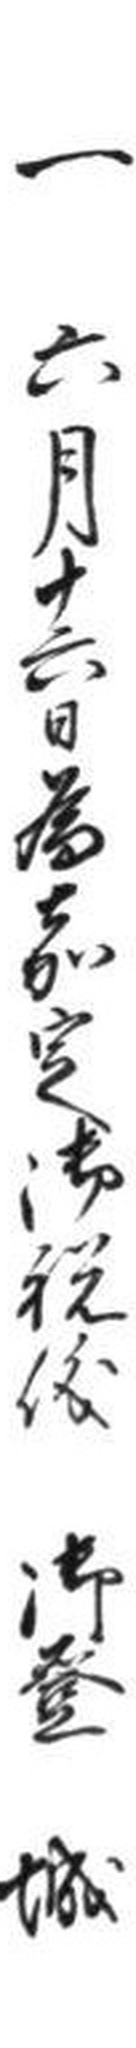一六月十六日為嘉定御祝儀御登城
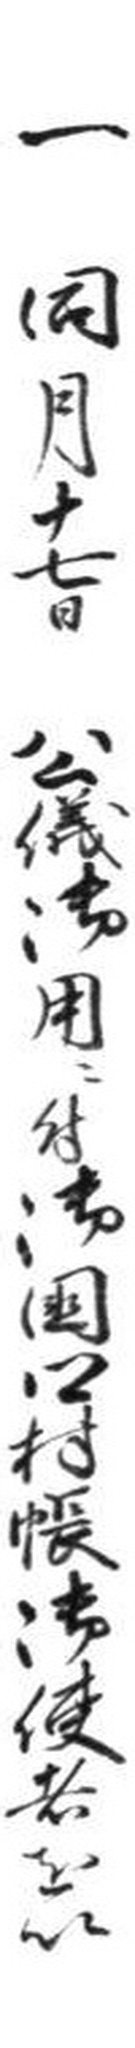一同月十七日公儀御用ニ付御国郷村帳御使者を以
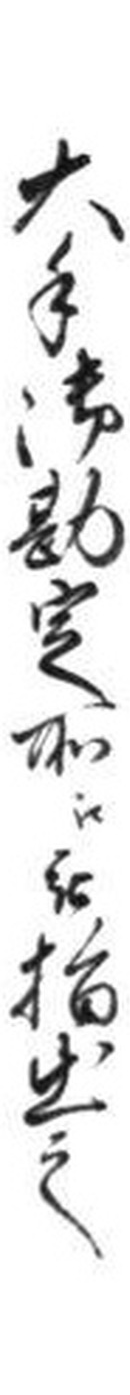大手御勘定所江被指出之
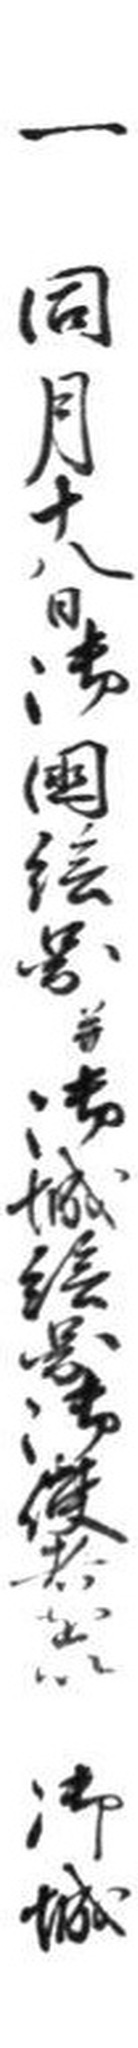一同月十八日御国絵図并御城絵図御使者を以御城
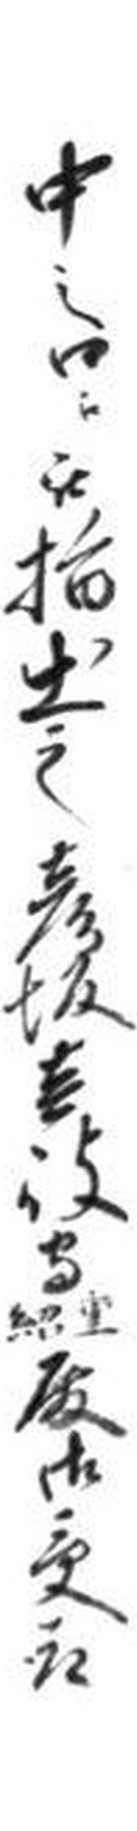中之口江被指出之彦坂壱岐守重紹殿御受取
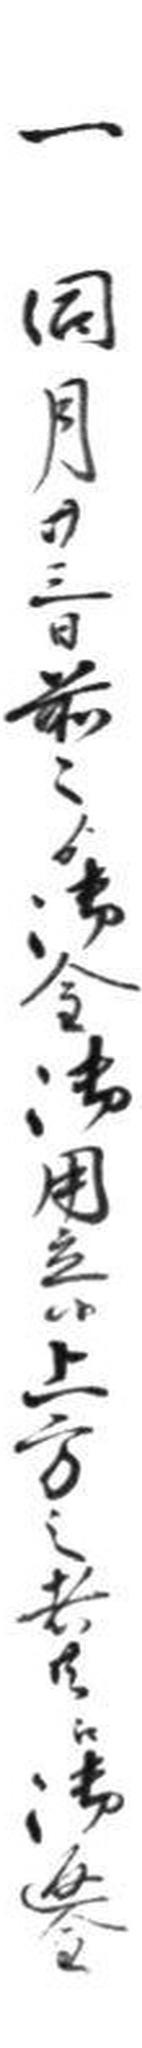一同月廿三日前々ゟ御金御用立候上方之者共江御返金
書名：家譜 十六 吉品公 従貞享三年閏三月到同四年
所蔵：福井県文書館 Fukui Prefectural Archives
